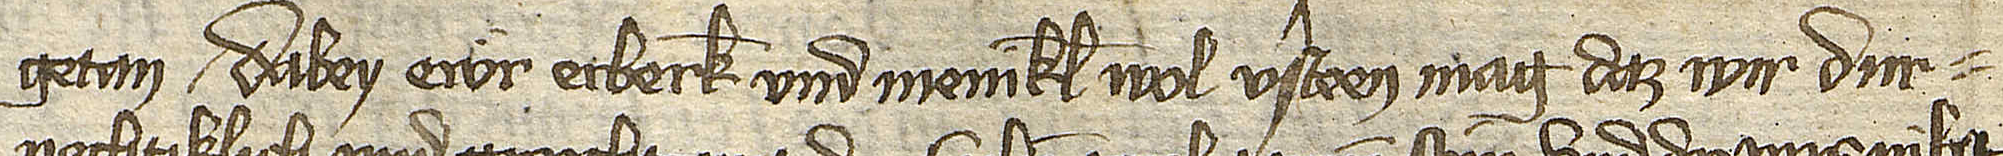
getan / Dabey eẅr erberk* vnd menikl* wol v*ſteen mag daʒ wir dur =
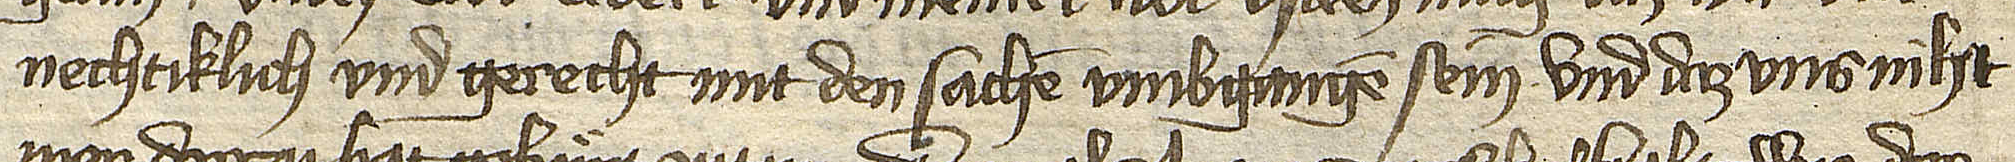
nechtiklich vnd gerecht mit den ſache* vmbgange* ſein vnd daʒ vns niht
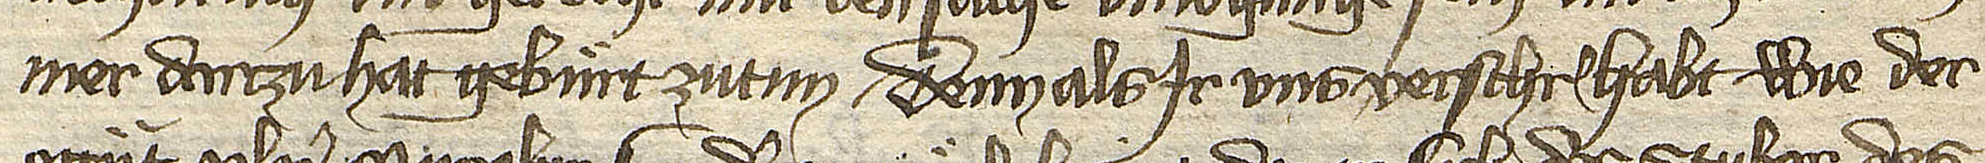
mer darcʒu hat gebürt ʒutun / Denn als Ir vns verſchr* habt / wie der
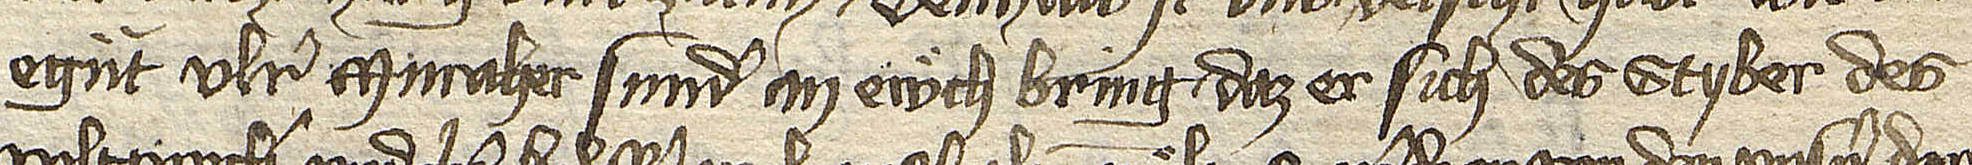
egnt* vlr* Muraher ſund* an eẅch bring / daʒ er ſich des Styber des
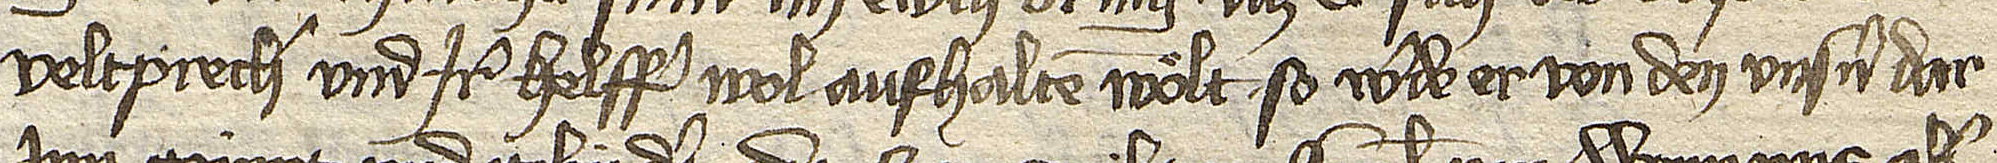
veltprech* vnd Ir* helff* wol aufhalte* wölt / ſo w*de er von den vnſn* dar
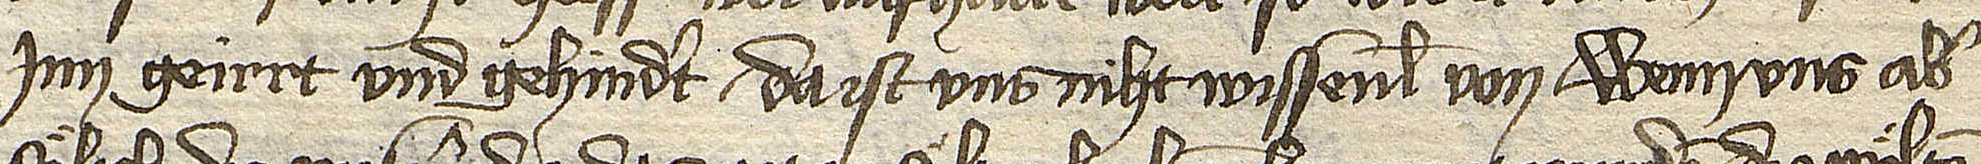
Inn geirrt vnd gehind*t / Da iſt vns niht wiſſenl* von / Wenn vns ab*
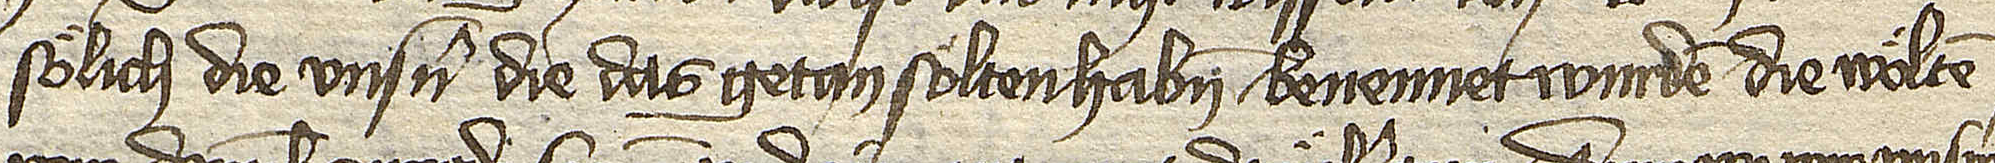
ſölich die vnſn* die das getan ſölten habn* / benennet wurde* / die wölte*
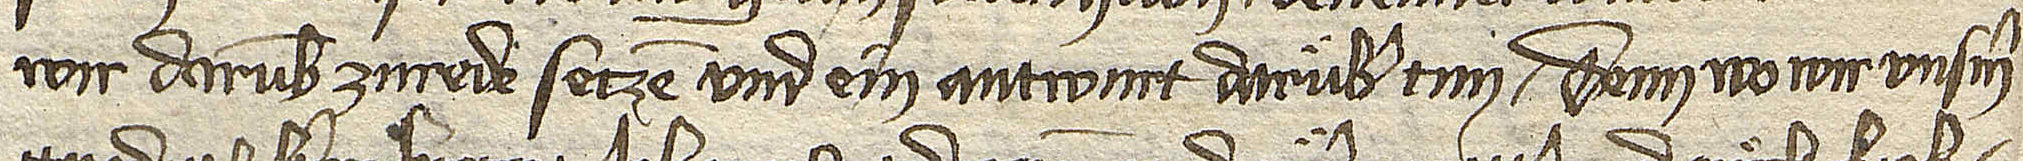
wir darub* ʒurede ſecʒe* vnd ein antwurt darüb* tun / Denn wo wir vnſm*
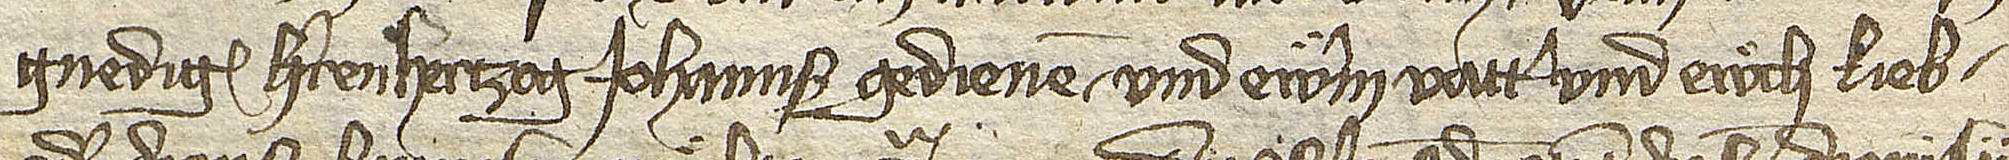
gnedig* h*ren hercʒog Iohannſ* gediene* / vnd eẅ*m vatt* vnd eẅch lieb /
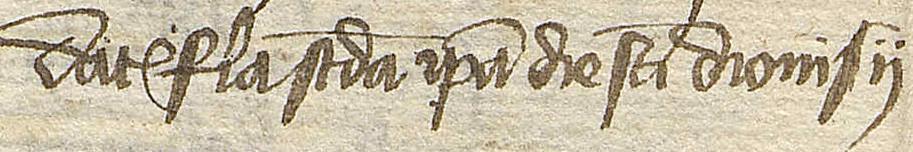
Dat* fi*a ſcda* ipa* die ſci* dioniſii
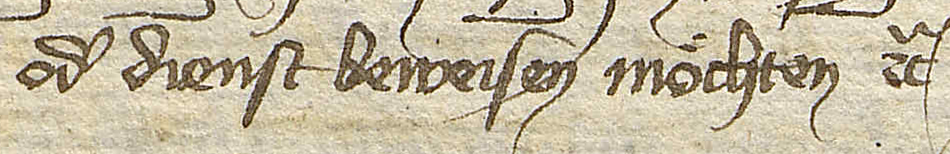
od* dienſt beweiſen möchten ec*
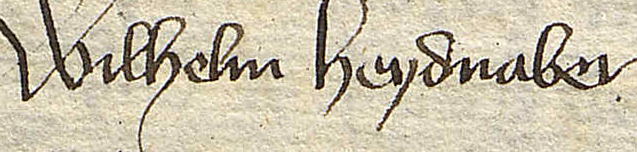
Wilhelm heydnaber
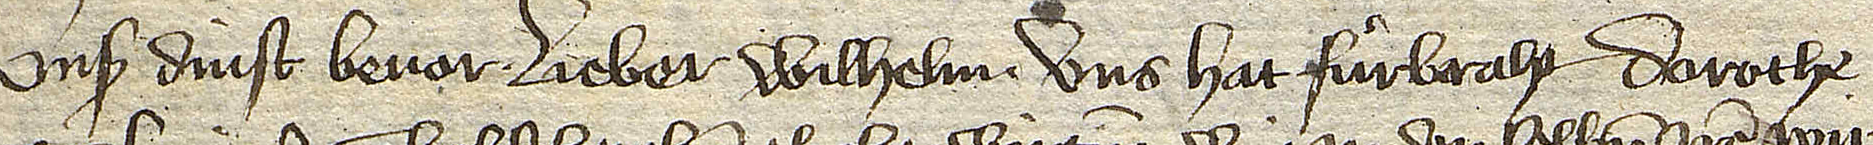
Vnſ* dinſt beuor . Lieber wilhelm . Vns hat fürbraht Dorothe
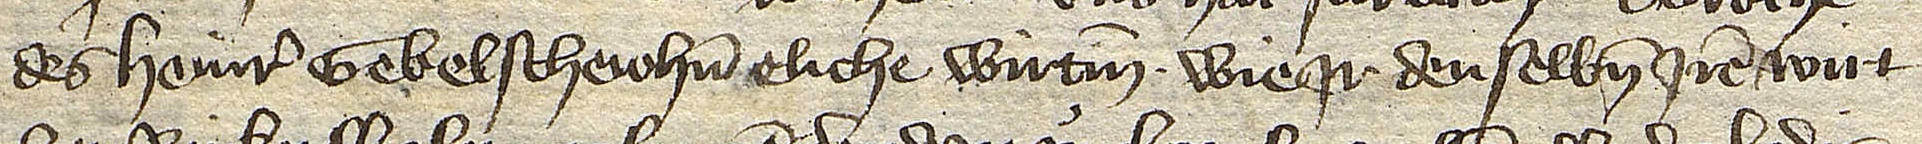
des heinr* Gebelſchewhn* eliche wirtin* . wie Ir den ſelbn* Ire* wirt
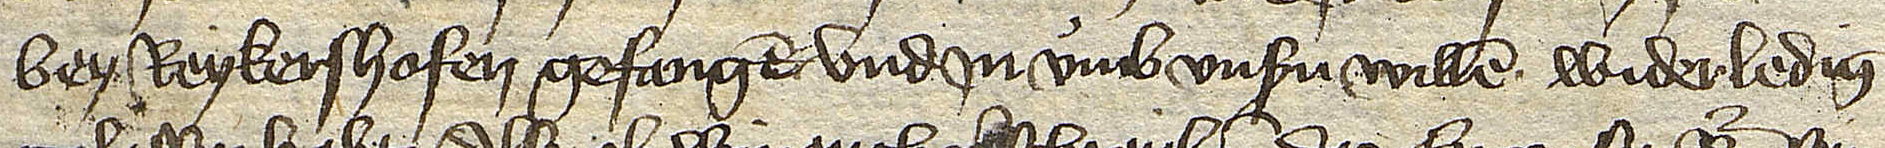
bey Reykerſhofen gefange* / vnd In v̈mb vnſ*n wille* . wider ledig
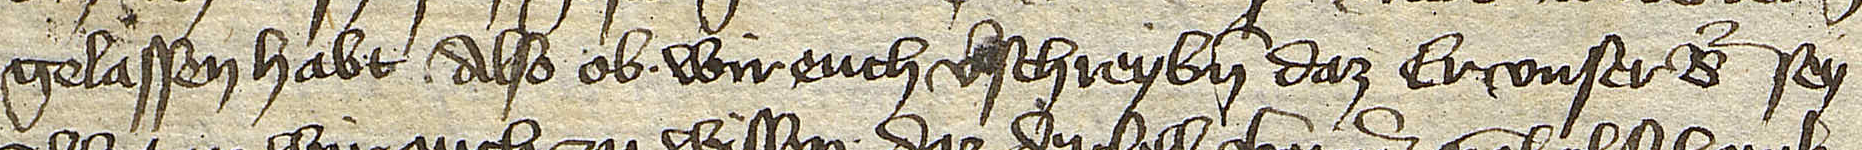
gelaſſen habt / Alſo ob . wir euch v*ſchreybn* daʒ Er vnſer B* ſey
